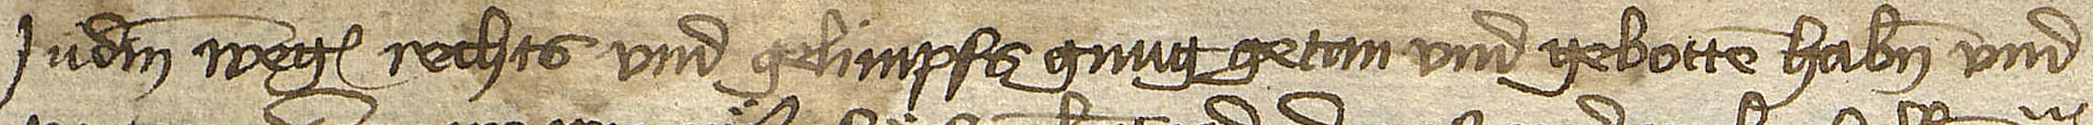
Iüdin* weg* rechts vnd gelimpfs gnug getan vnd gebotte* habn* vnd
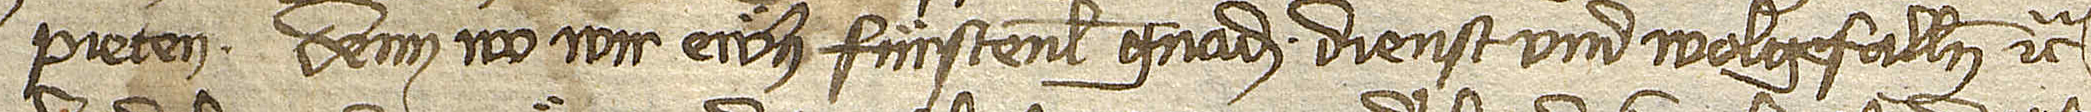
pieten . Denn wo wir ew*n fürſtenl* gnad* . dienſt vnd wolgefalln* ec*
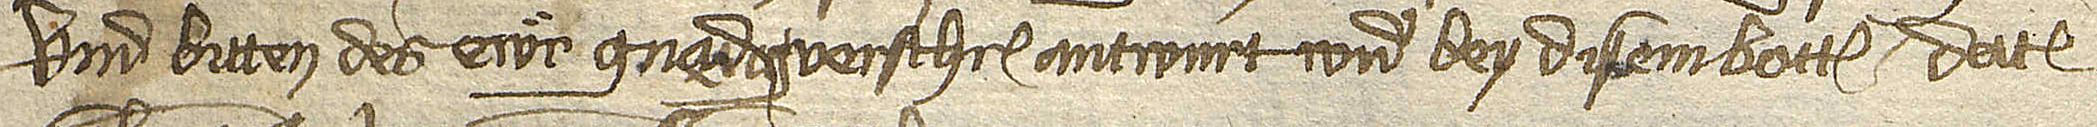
Vnd bitten des ewr gnad* verſchr* antwurt wid* bey diſem bott* / Dat*
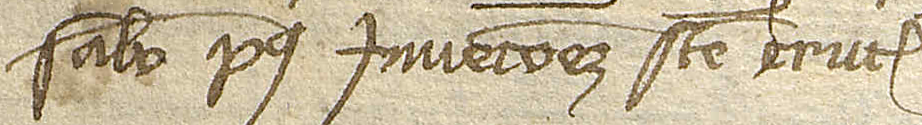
ſabo* p* Inucoe* ſce*cruc*
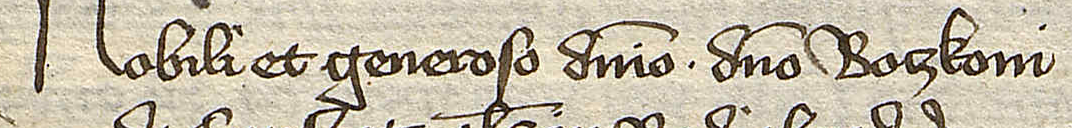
Nobile et generoſo d*nio . d*no Bocʒkoni
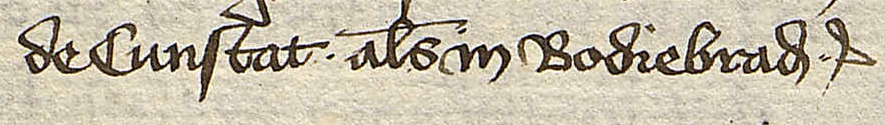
de Cunſtat . al*s in Bodiebrad §
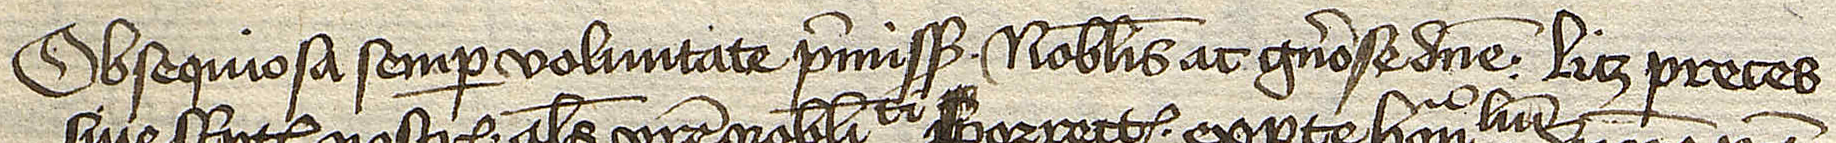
Obſequioſa ſemp* voluntate p*miſſ* . Nob*lis ac g*n*oſe d*ne . Licʒ preces
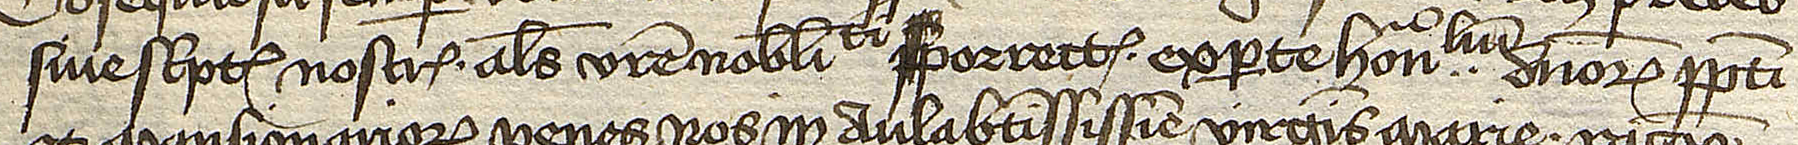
ſiue ſc*pt* noſtr* . al*s v*re nobil* pporrect* . exp*te hon* . d*nor* p*p*ti
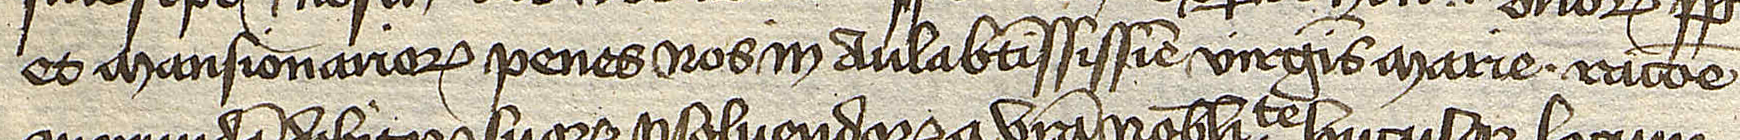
et Manſionarior* penes nos in Aula b*tiſſiſſi*e virg*is Marie . rac*o*e
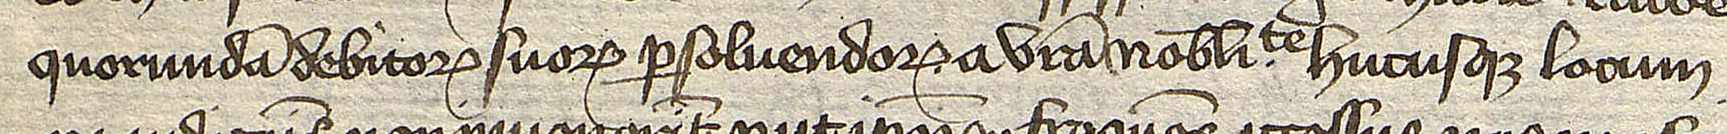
quorunda* debitor* ſuor* p*ſoluendo* a v*ra nob*li* hucuſq* locum
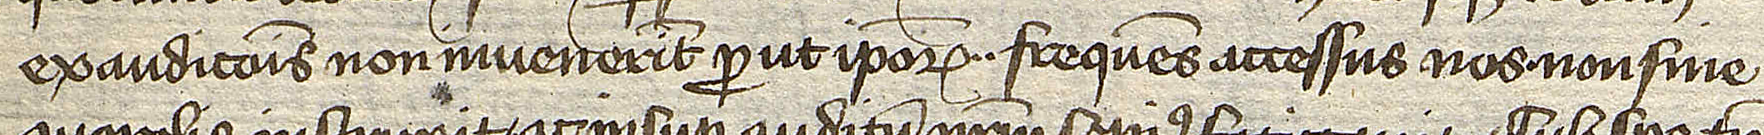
ex audic*o*is non inueneri*t p*ut ip*or* ~ freque*s acceſſus nos non ſive
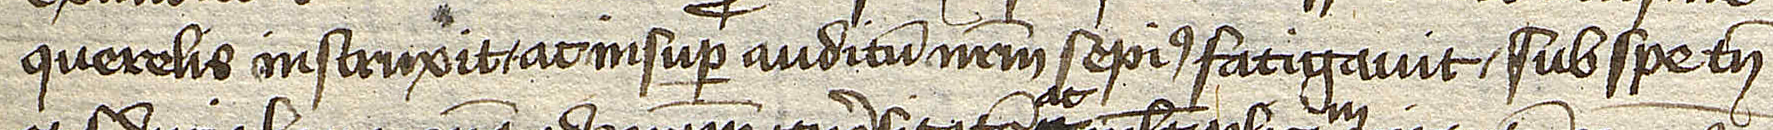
querelis inſtruxit / ac inſup* auditu* n*r*m ſepi* fatigauit / ſub ſpe t*n
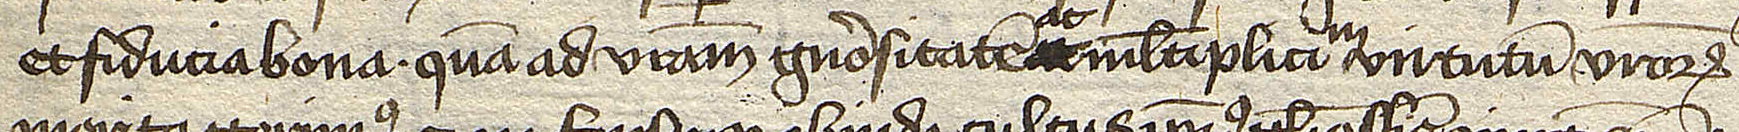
et fiducia bona . qua* ad v*ram g*n*oſitate* ac m*ltiplici*m virtutu* v*ro*
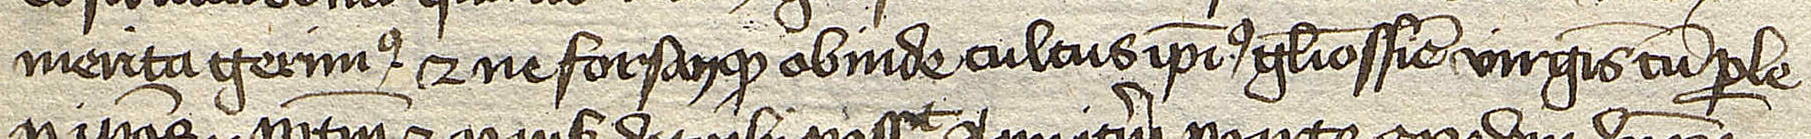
merita gerim* @ ne forſanq* obinde cultus ip*i* gl*ioſſi*e virgi*is cu* p*le
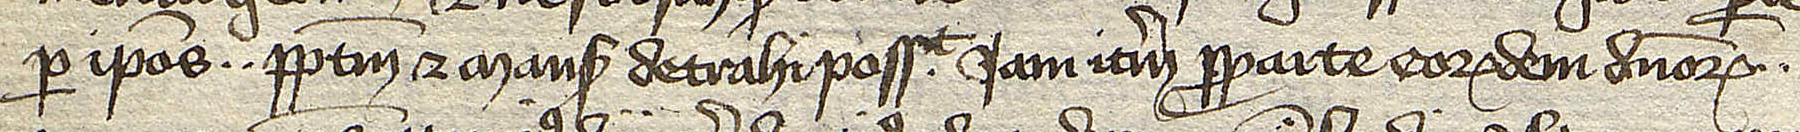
p* ip*os . . p*p*t*m @ Manſ* detrahi poſſ*t . Iam it*m p*parte eo* d*nor*
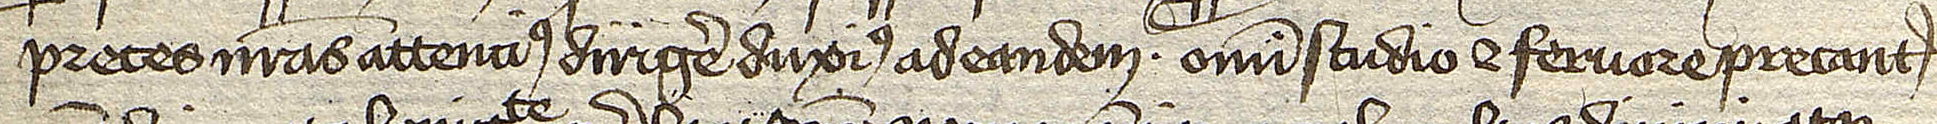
preces n*ras attenci* dirige* duxi* ad eandem . om*i ſtudio et feruore precant*
